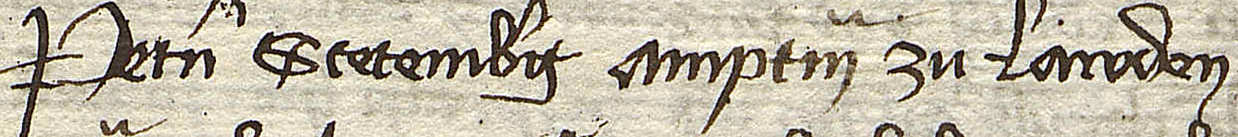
Petn* Stetemb*g amptm* ʒu Lawden
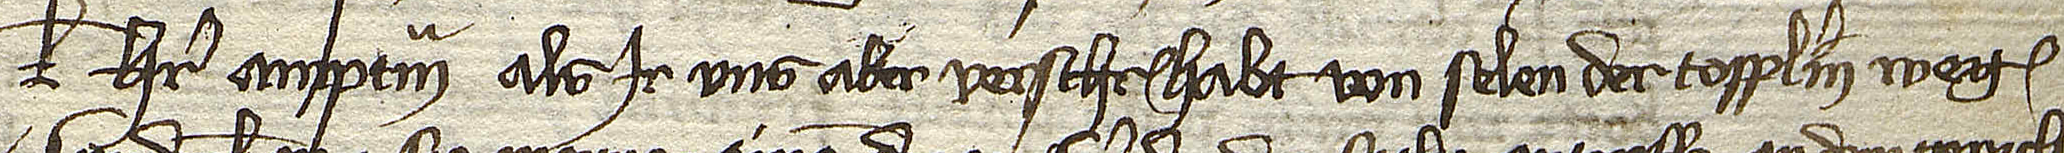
L* Hr* amptm* als Ir vns aber verſchr* habt von ſelen der toppl*in weg*
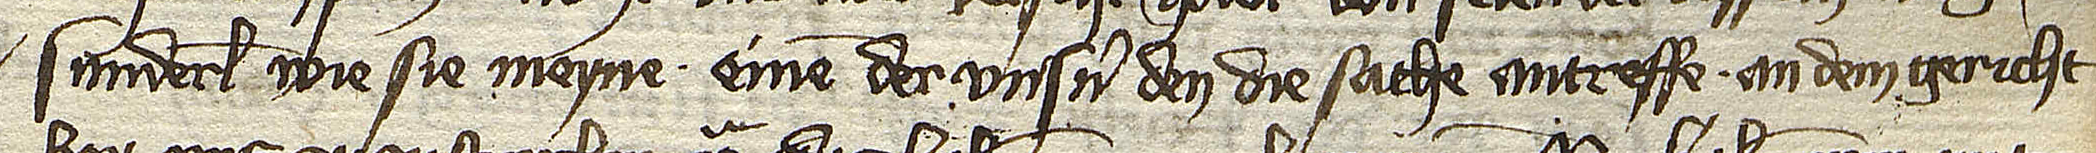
ſunderl* wie ſie meyne . eine* der vnſn* den die ſache antreffe . an dem gericht
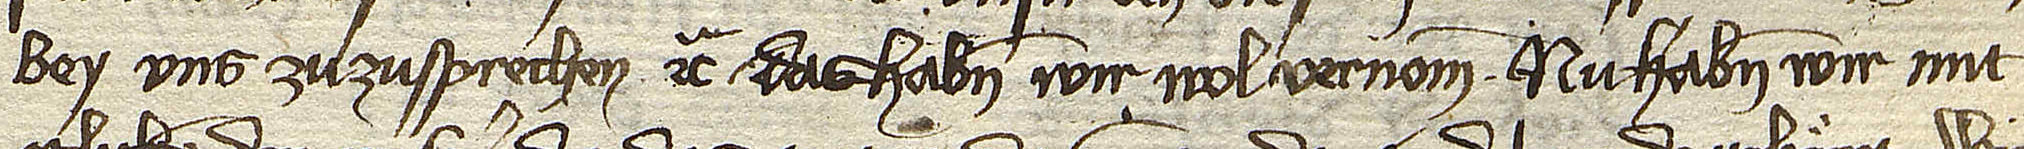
bey vns ʒu ʒuſprechen ec* / das habn* wir wol vernom* . Nu habn* wir mit
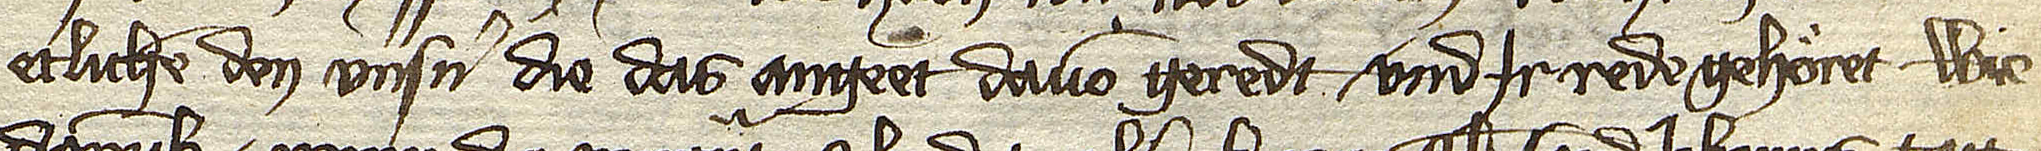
etliche* den vnſn* die das angeet dauo* geredt / vnd Ir rede gehöret wie
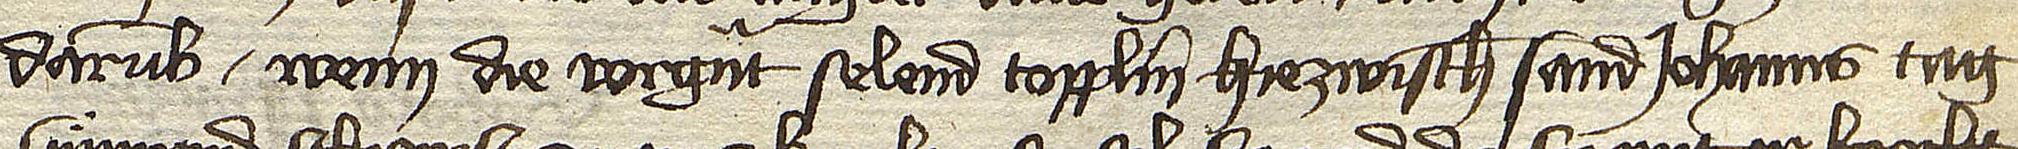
darub* / wenn die vorgnt* ſelend toppl*in hieʒwiſch* ſand Iohanns tag
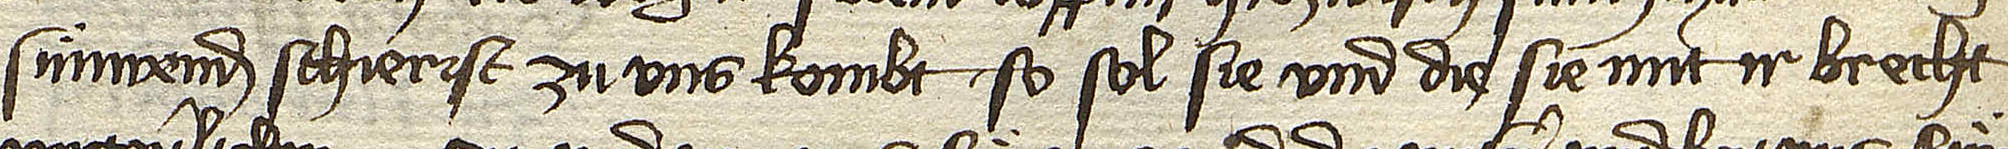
ſünwend* ſchieriſt ʒu vns kombt / ſo ſol ſie vnd die ſie mit ir brecht
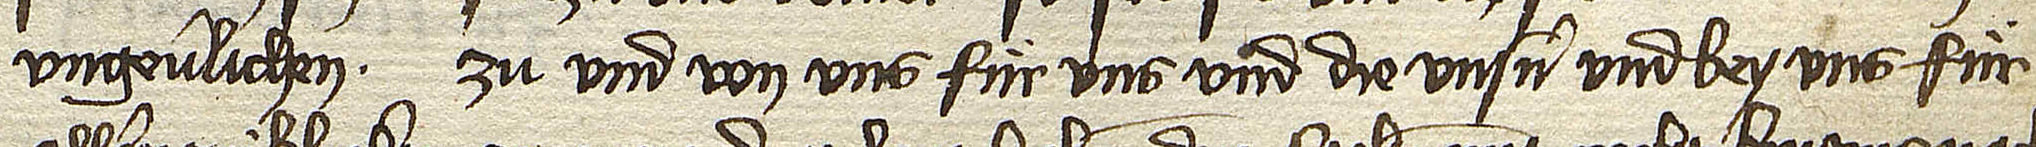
vngeu*lichen . ʒu vnd von vns für vns vnd die vnſn* vnd bey vns für
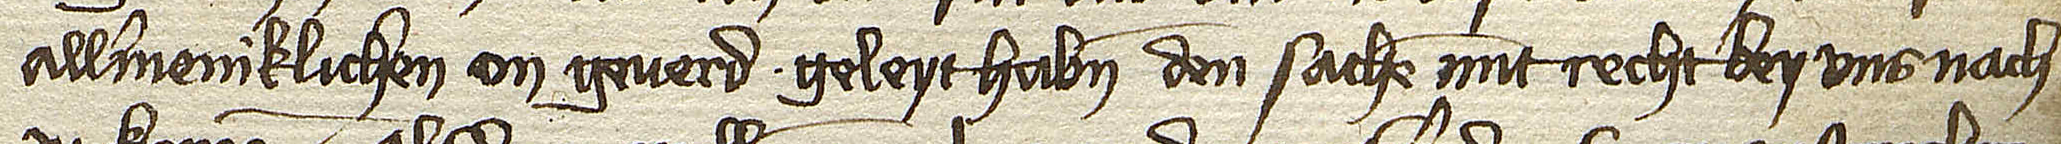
all*meniklichen on geuerd . geleyt habn* den ſache* mit recht bey vns nach
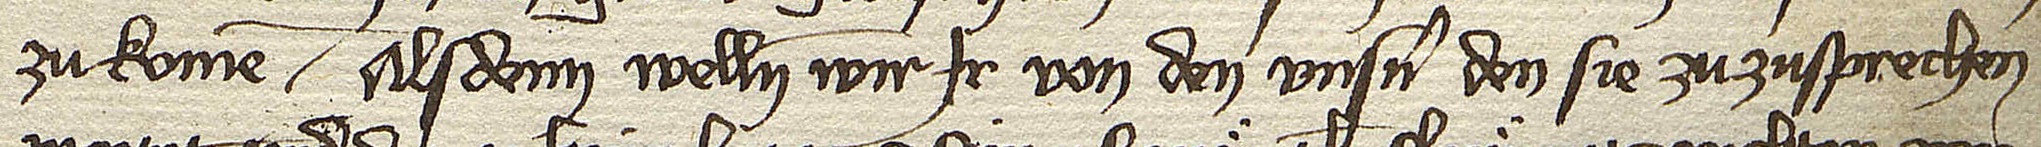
ʒukome* / Alſdenn welln* wir Ir von den vnſn* den ſie ʒuʒuſprechen
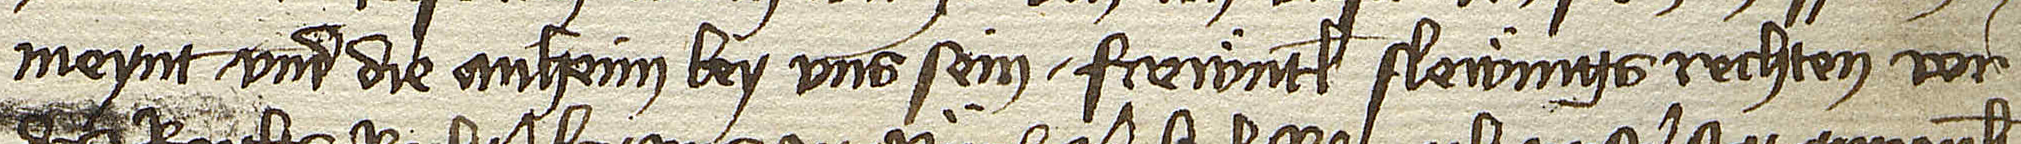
meynt / vnd die anheim bey vns ſein / freẅntl* ſleẅnigs rechten vor
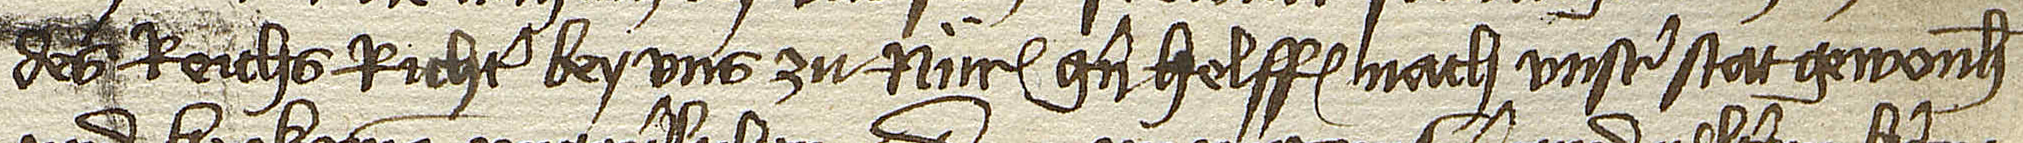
des Reichs Richt* bey vns ʒu Nür* g*n helff* nach vnſr* ſtat gewonh*
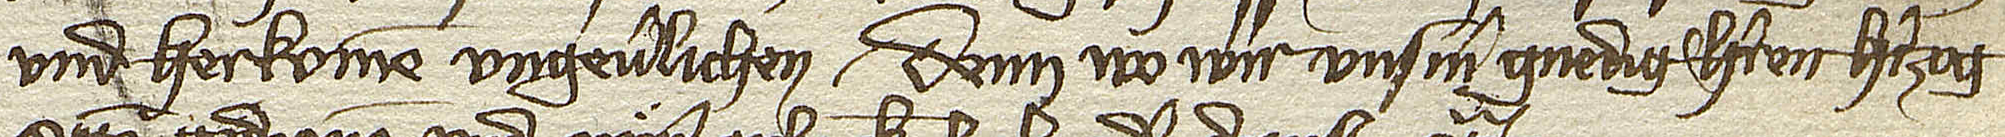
vnd herkome* vngeu*lichen / Denn wo wir vnſm* gnedig* h*ren h*cʒog
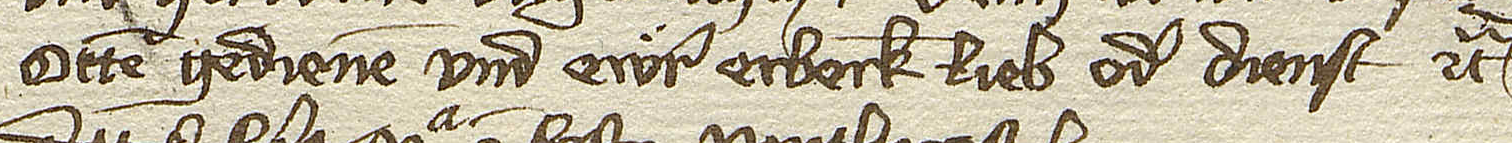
Otte* gediene* vnd eẅr* erberk* lieb od* dienſt ec*
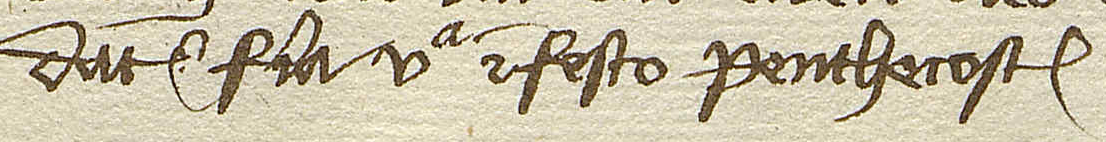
Dat* fi*a v* i* feſto Penthecoſt*
